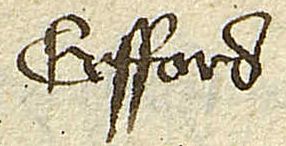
Erfford
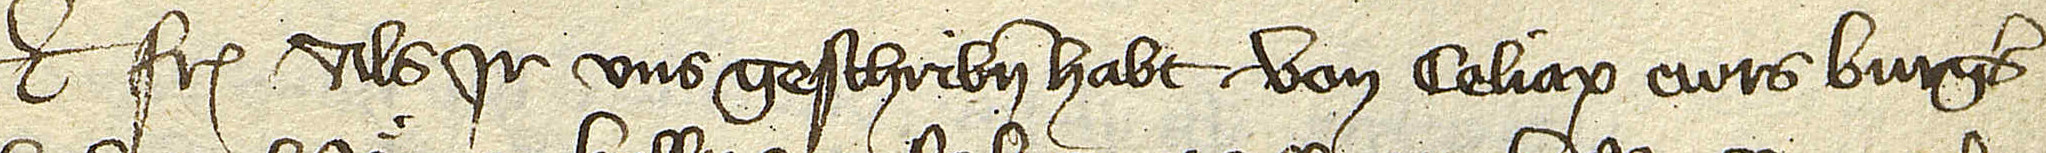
L* fr* / Als Ir vns geſchribn* habt / von Celiax ewrs burgs*
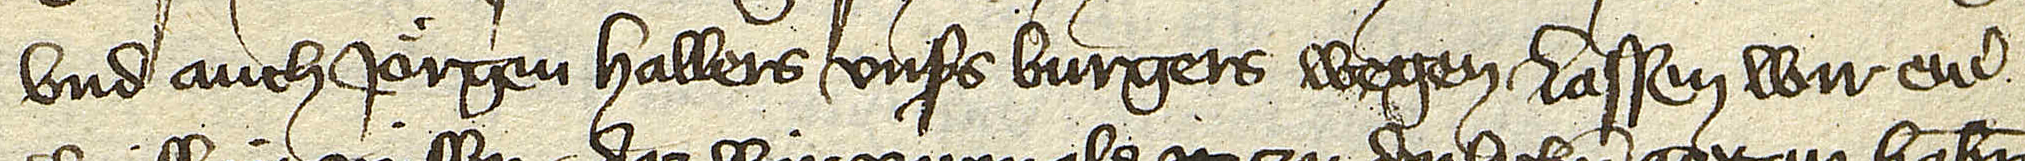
vnd auch Iörgen hallers vnſ*s burgers wegen / Laſſen wir ew*
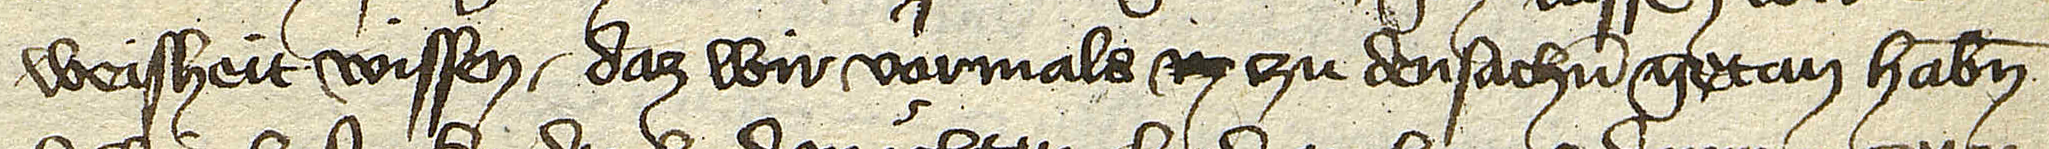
weiſheit wiſſen / daʒ wir vormals in cʒu denſachn* getan habn*
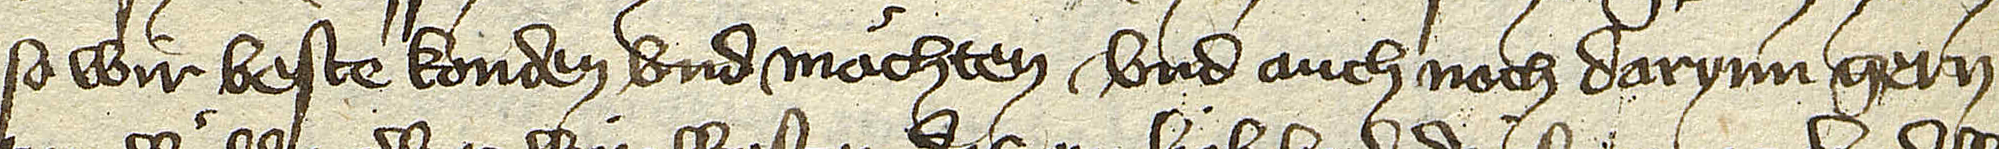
ſo wir beſte konden vnd möchten / vnd auch noch darynn gern
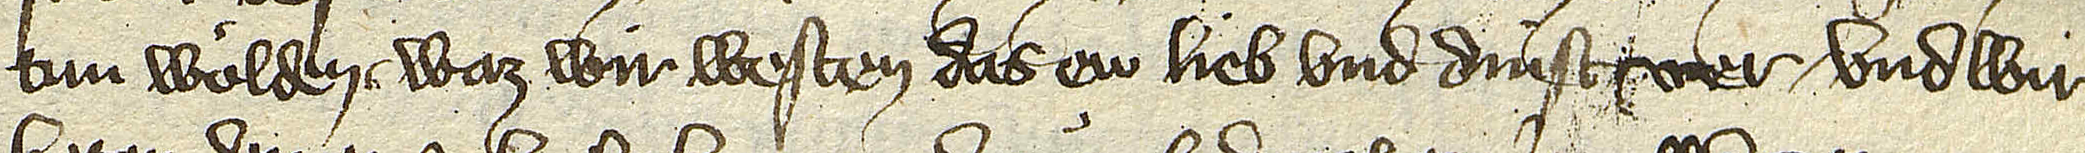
tun wölden / waʒ wir weſten das ew lieb vnd dinſt wer / vnd wir
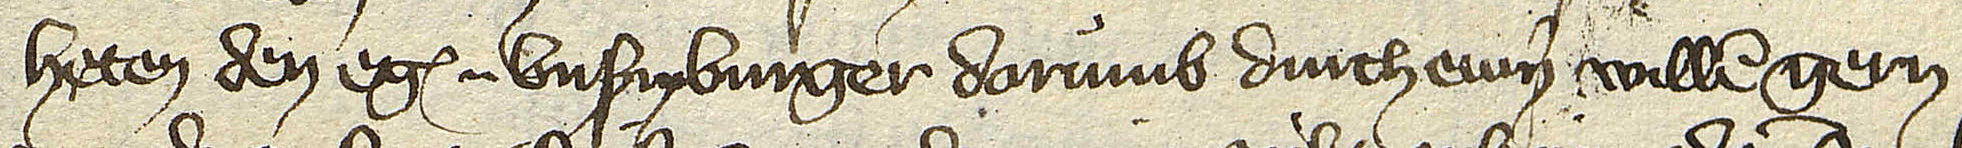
heten den eg* ~ vnſ*m burger darümb durch ew*n wille* gern
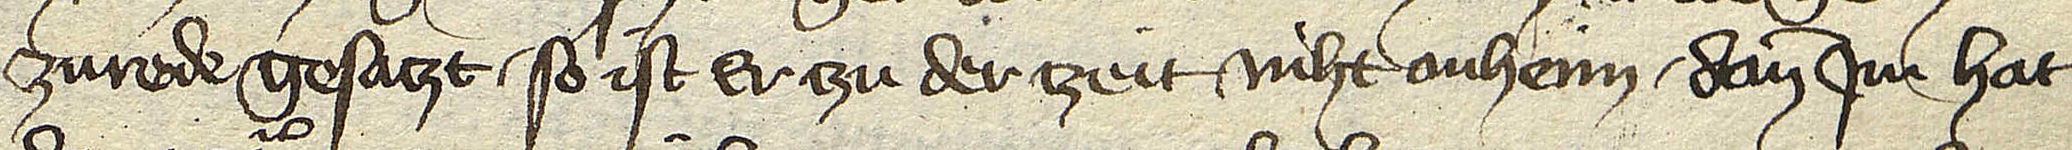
cʒurede geſacʒt / ſo iſt Er cʒu der cʒeit niht anheim / dan* Im hat
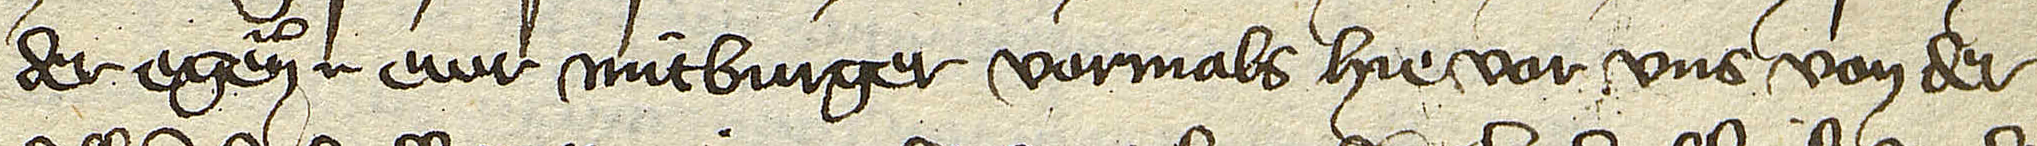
der egen* ~ ewr mitburger vormals hie vor vns von der
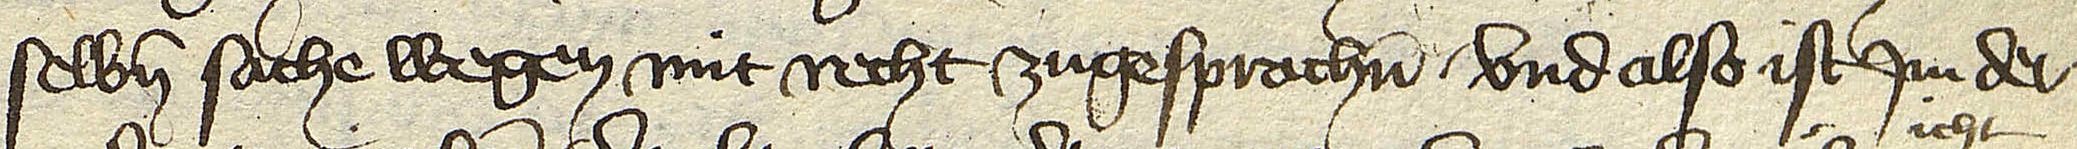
ſelbn* ſache wegen mit recht cʒuſprochn* / vnd alſo iſt Im der
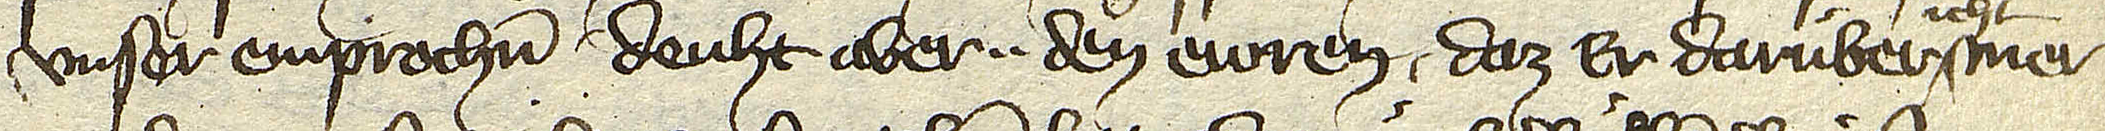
vnſer einprochn* / deuht aber ~ den ewren / daʒ Er darüber mer
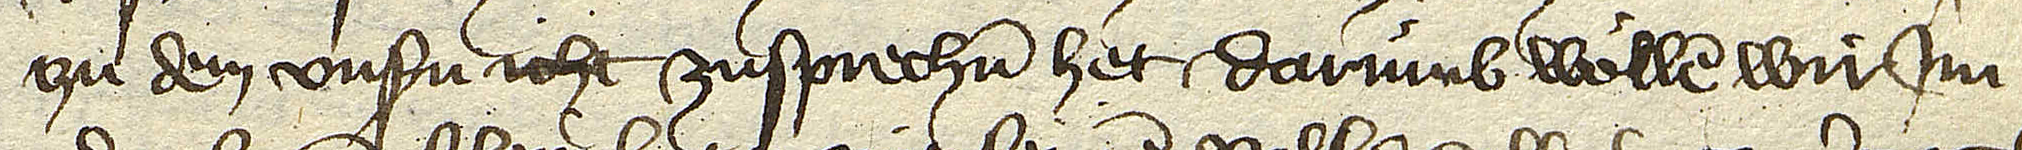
cʒu dem vnſ*n icht cʒuſprechn* het / darümb wölle* wir Im
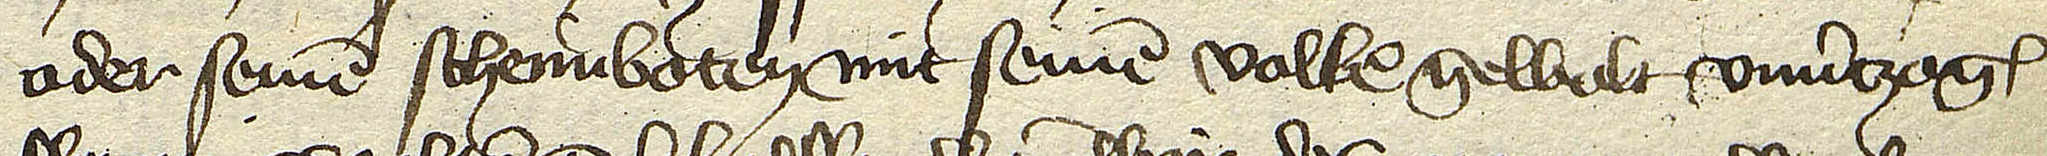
oder ſeine* ſcheimboten mit ſeine* volle* gewalt vnu*cʒog*
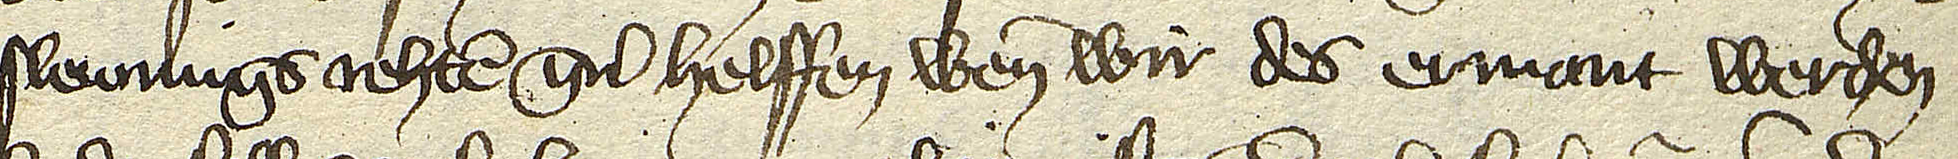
ſlewnigs rehte* gn* helffen wen* wir des ermant werden
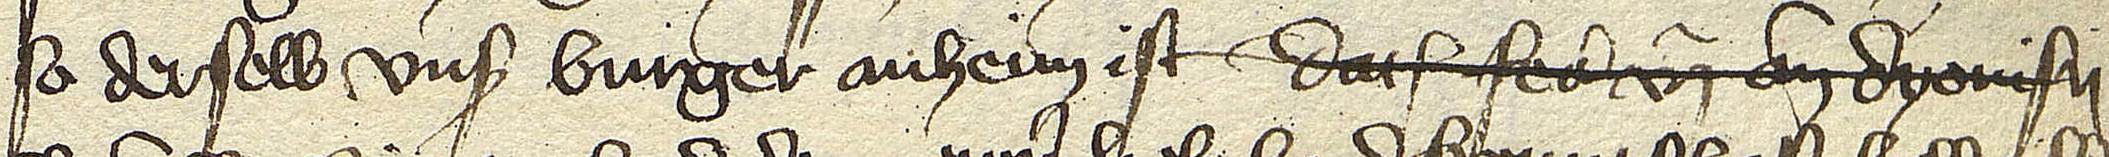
ſo derſelb vnſ* burger anheim iſt / dat* fea* vi* an* dyoniſii
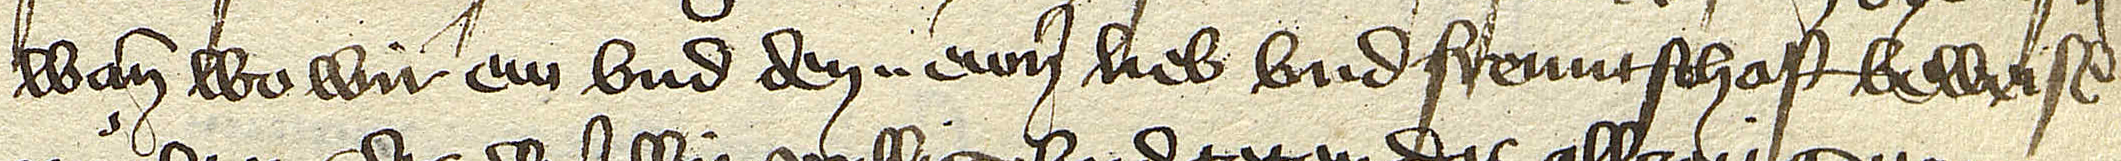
wan* wo wir ee vnd den ~ ewn* lieb vnd freuntſchaft beweiſe*
